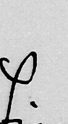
t.
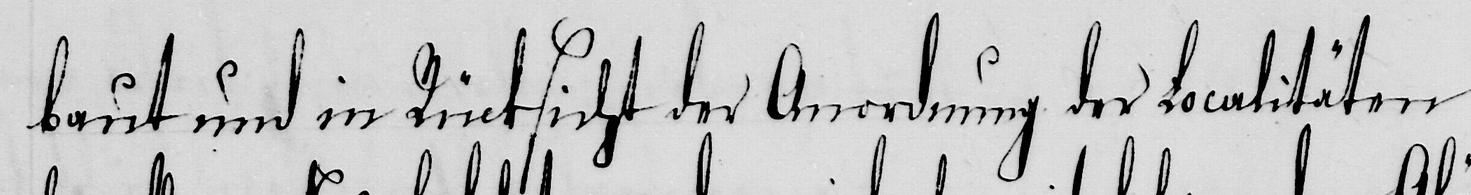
baut und in Rücksicht der Anordung derLocalitäten
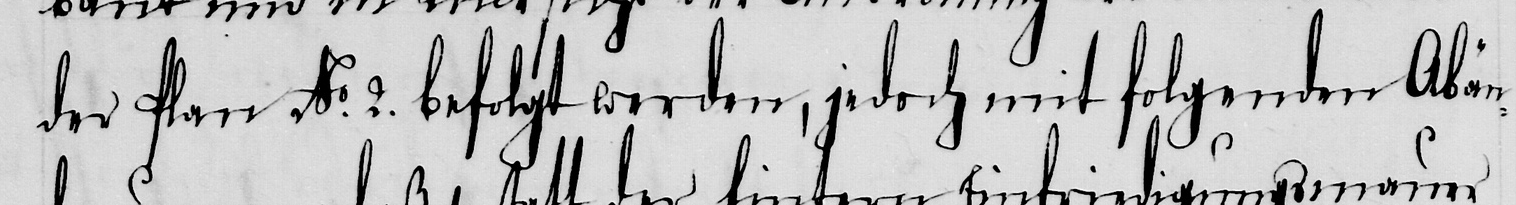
der Plan No. 2. befolgt werden, jedoch mit folgenden Abä¬
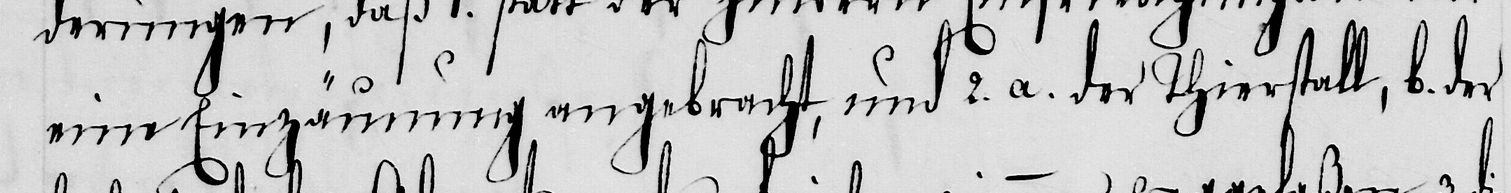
eine Einzäunung angebracht, und 2. a. der Thierstall, b. d¬
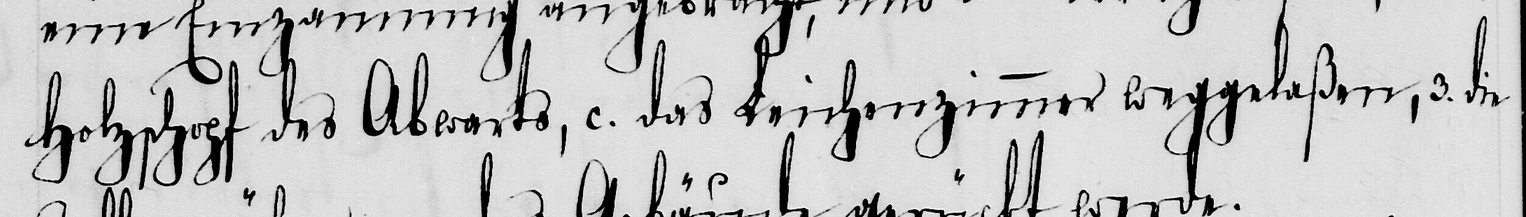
Holzschopf des Abwartes, c. das Leichenzimmer weggelaßen, 3. die
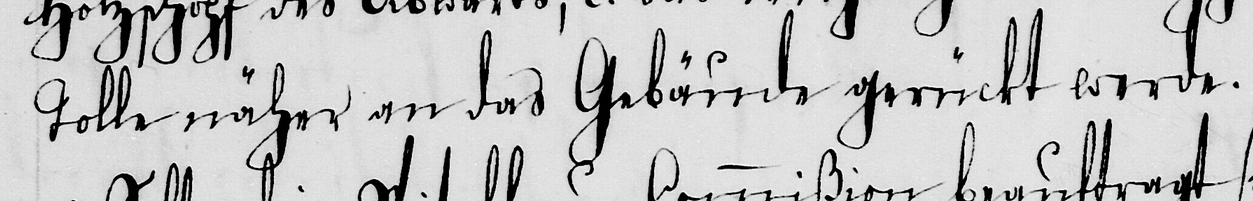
Tolle näher an das Gebäude gerückt werde.
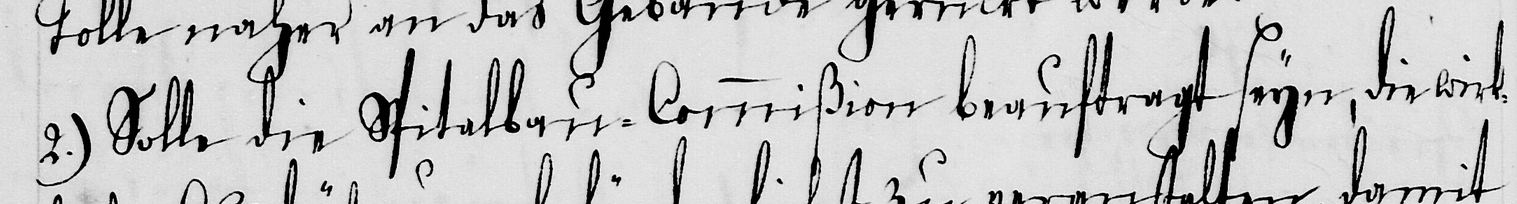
2.) Solle die Spitalbau-Commißion beauftragt seyn, die wir¬
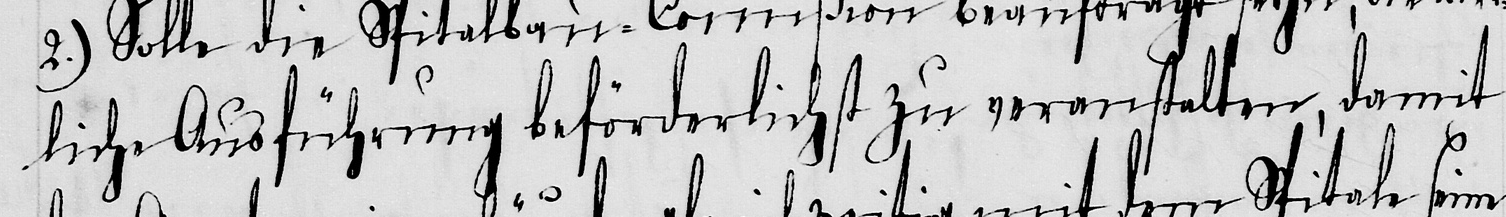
kliche Ausführung beförderlichst zu veranstalten, damit
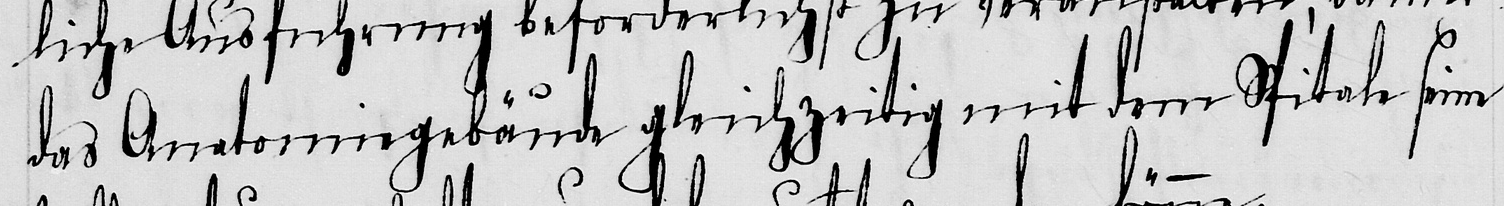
das Anatomiegebäude gleichzeitig mit dem Spitale seine
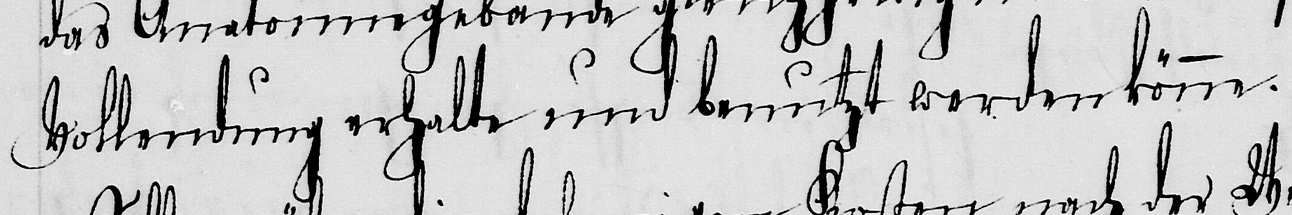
Vollendung erhalte und benutzt werden könne.
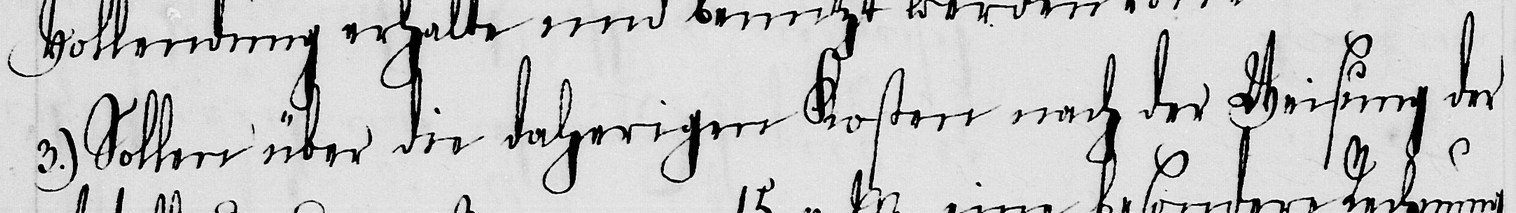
3.) Sollen über die daherigen Kosten nach der Weisung der
